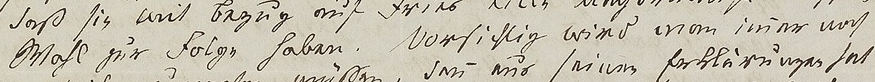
Wahl zur Folge haben. Vorsichtig wird man immer noch
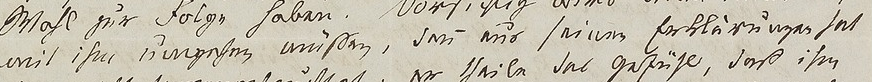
mit ihm umgehen müssen, denn aus seinen Erklärungen hat
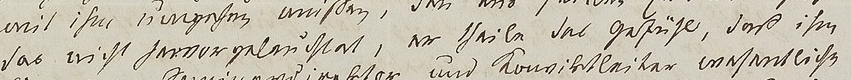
das nicht hervorgeleuchtet, er theile das Gefühl, daß ihm
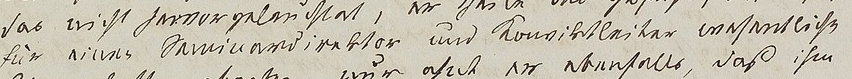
für einen Seminardirektor und Konviktleiter wesentliche
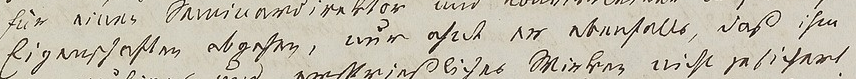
Eigenschaften abgehen, nur ahnt er ebenfalls, daß ihm
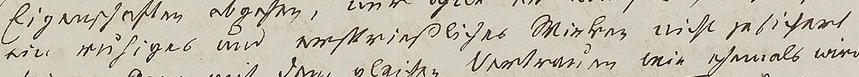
ein ruhiges und ersprießliches Wirken nicht gesichert
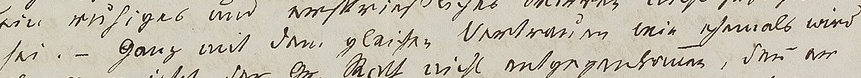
sei. – Ganz mit dem gleichen Vertrauen wie ehemals wird
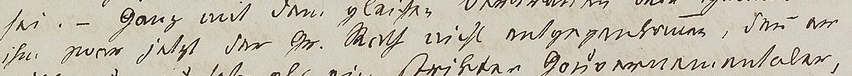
ihm zwar jetzt der Gr. Rath nicht entgegenkommen, denn er
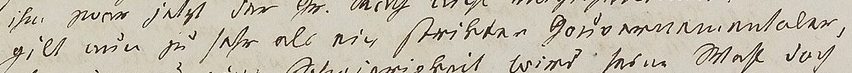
gilt nun zu sehr als ein strikter Gouvernementaler,
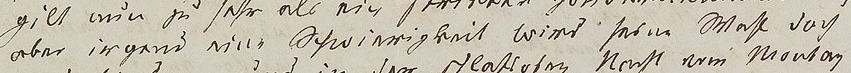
aber irgend eine Schwierigkeit wird seine Wahl doch
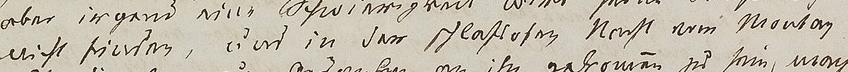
nicht finden, und in der schlaflosen Nacht vom Montag
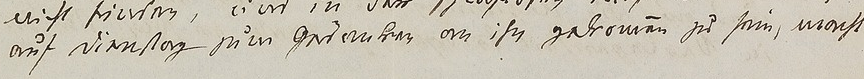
auf Dienstag zum Gedanken an ihn gekommen zu sein, macht
